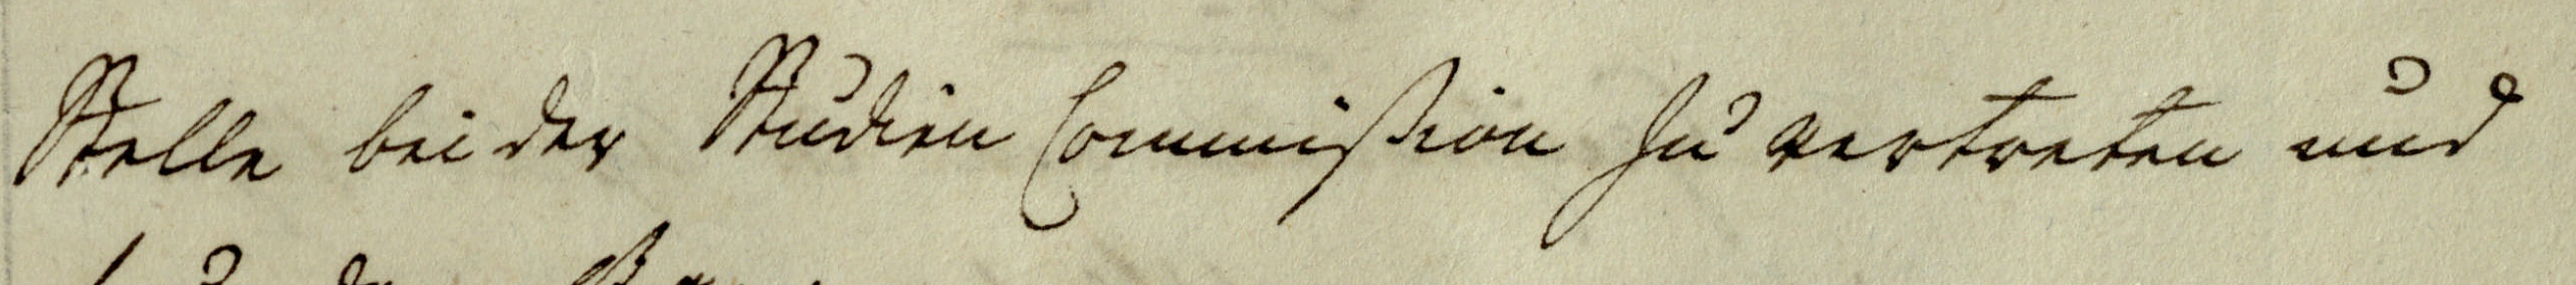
Stelle bei der Studien Commission zu vertreten und
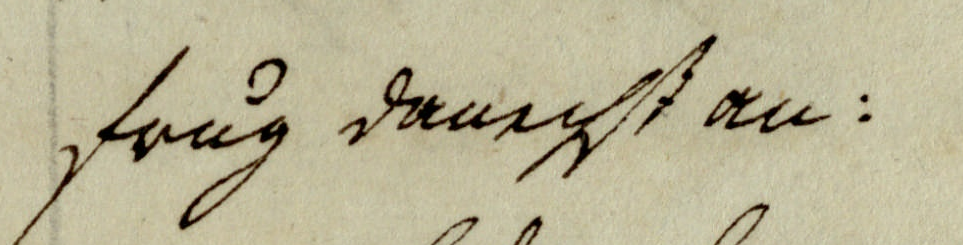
frug danechst an:
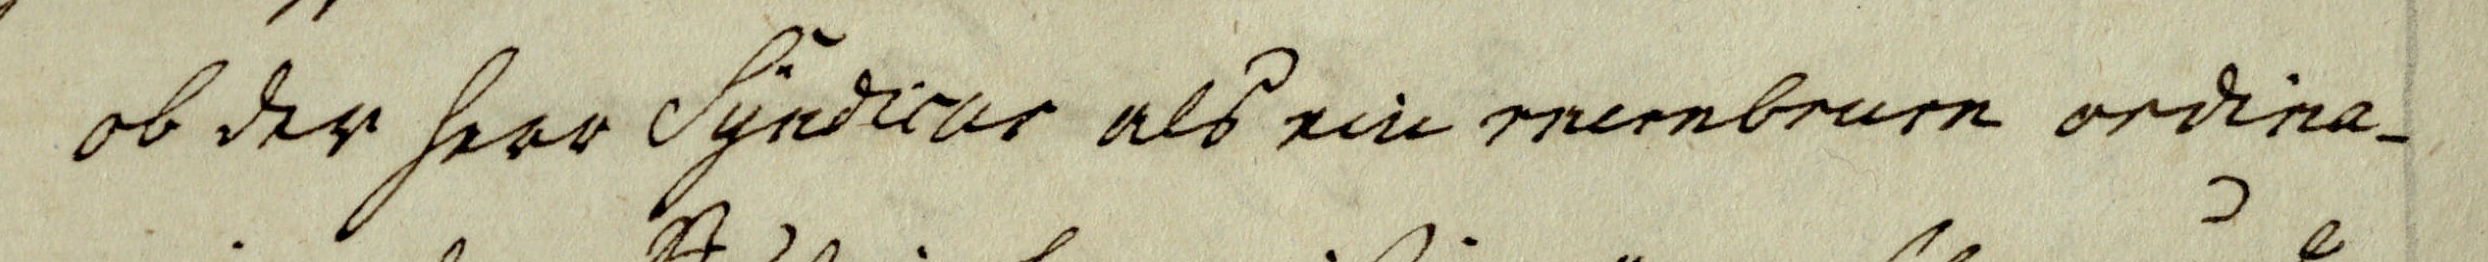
ob der Herr Sÿndicus als ein membrum ordina¬
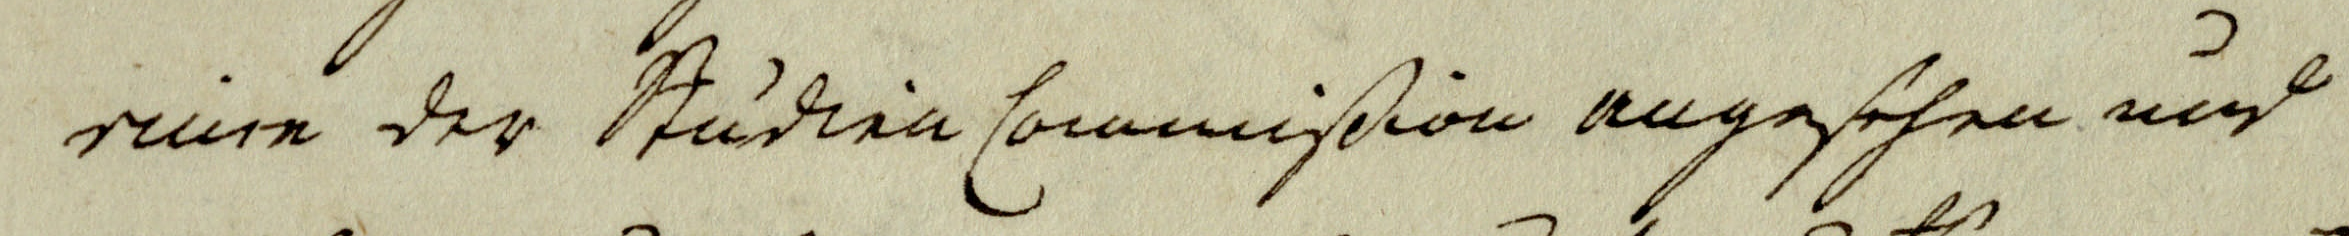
rium der Studien Commission angesehen und
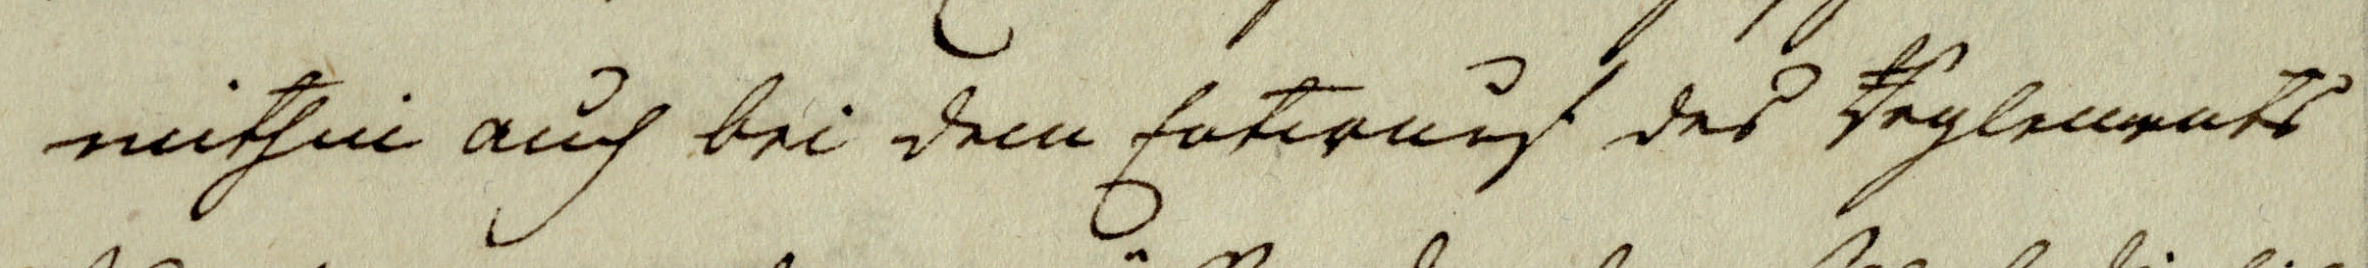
mithin auch bei dem Entwurf des Reglements
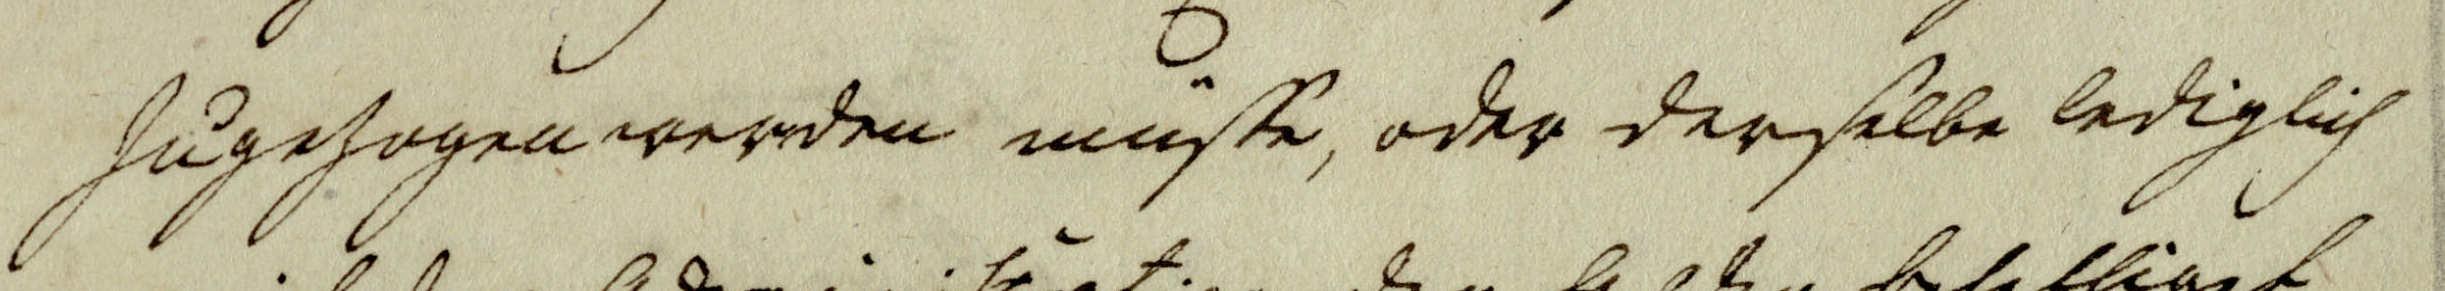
zugezogen werden müsse, oder derselbe lediglich
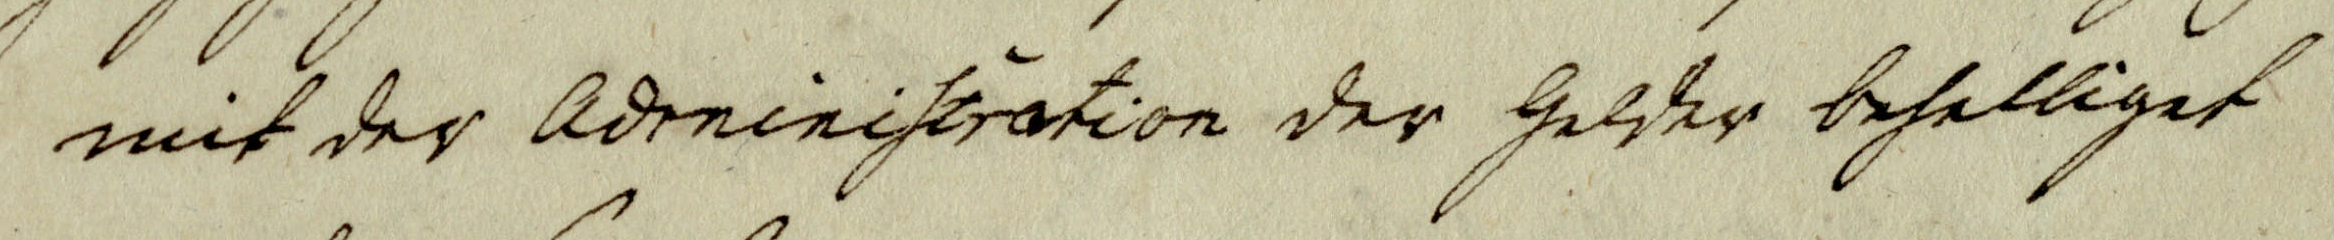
mit der Administration der Gelder behelliget
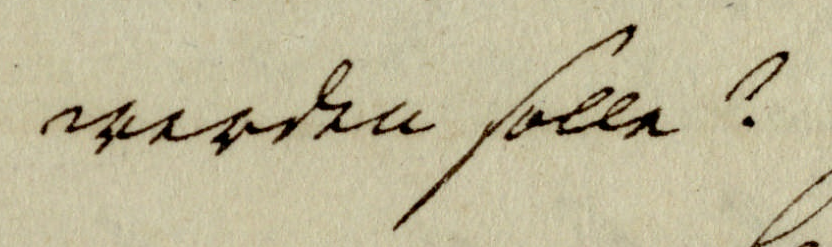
werden solle?
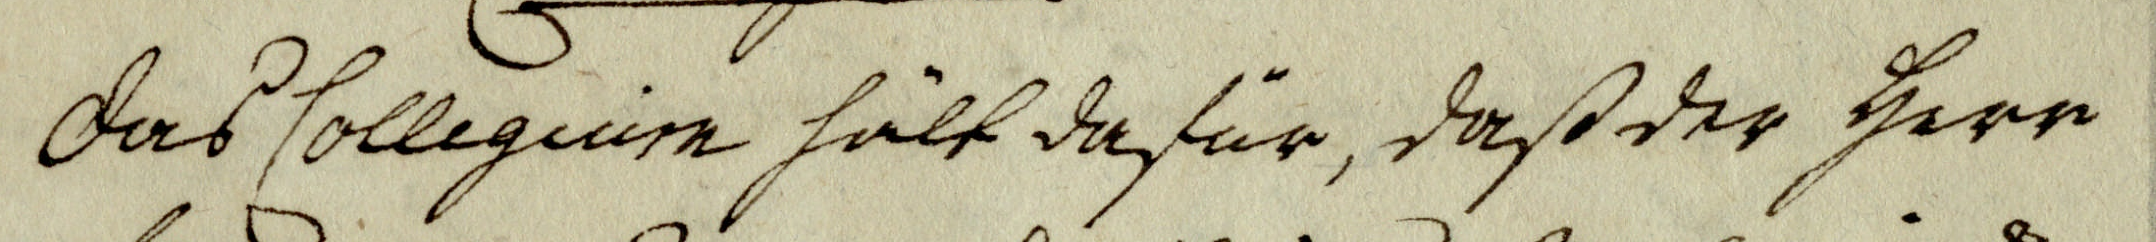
Das Collegium hält dafür, daß der Herr
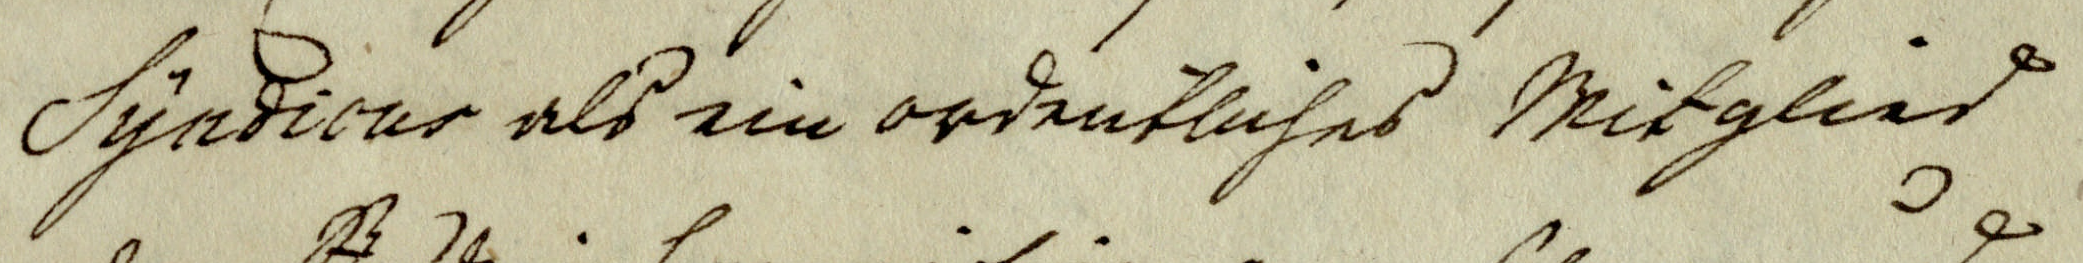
Sÿndicus als ein ordentliches Mitglied
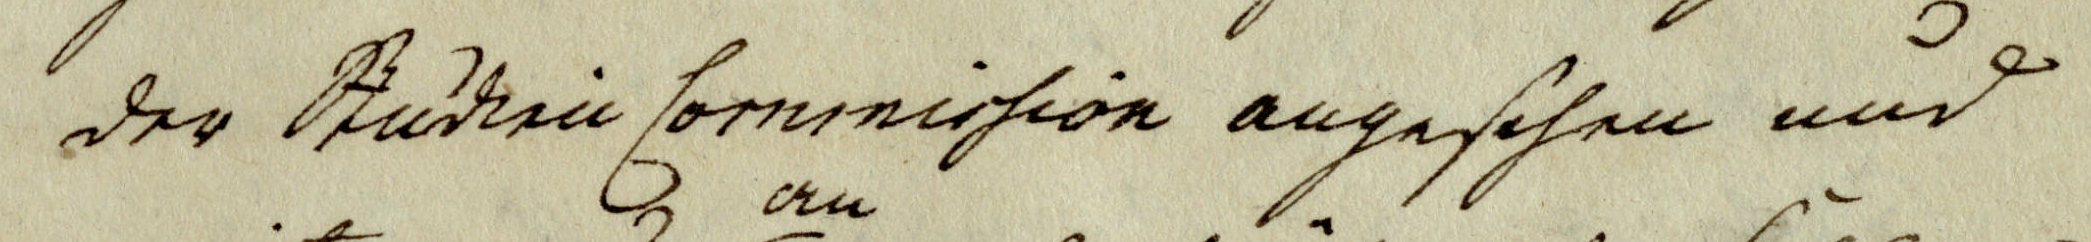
der Studien Commission angesehen und
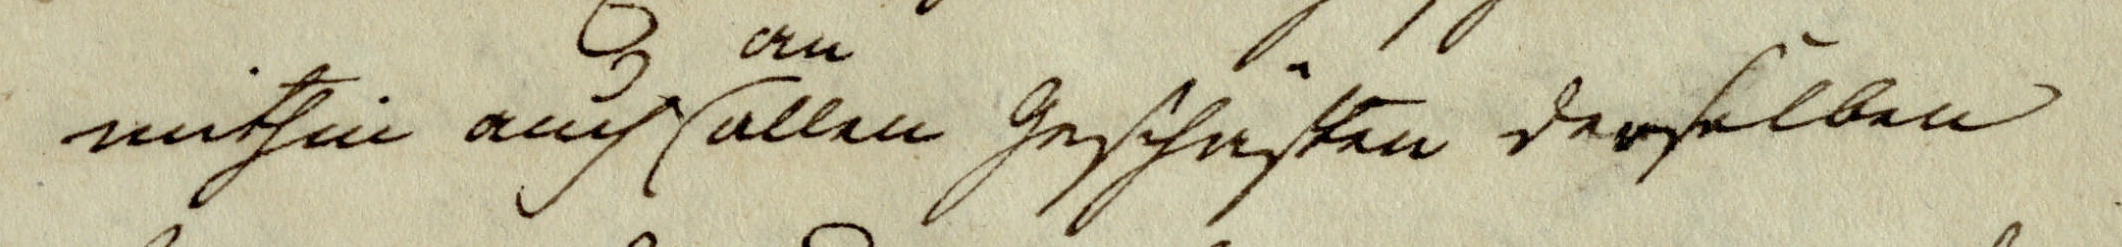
mithin auch an allen Geschäften derselben
